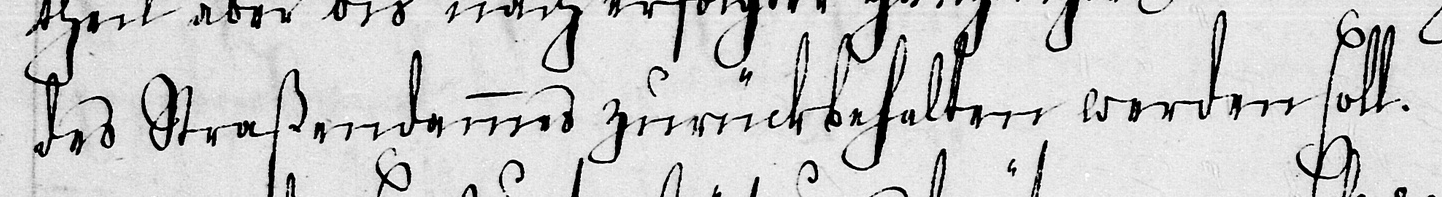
des Straßendammes zurückbehalten werden soll.
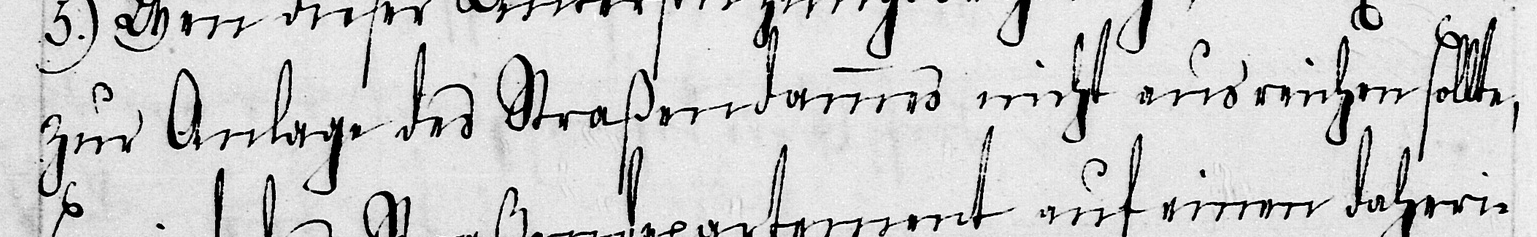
zur Anlage des Straßendammes nicht ausreichen sollt¬
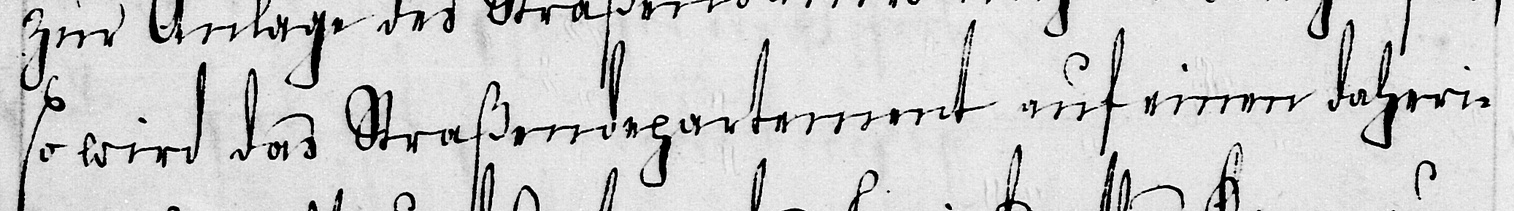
so wird das Straßendepartement auf einen daheri¬
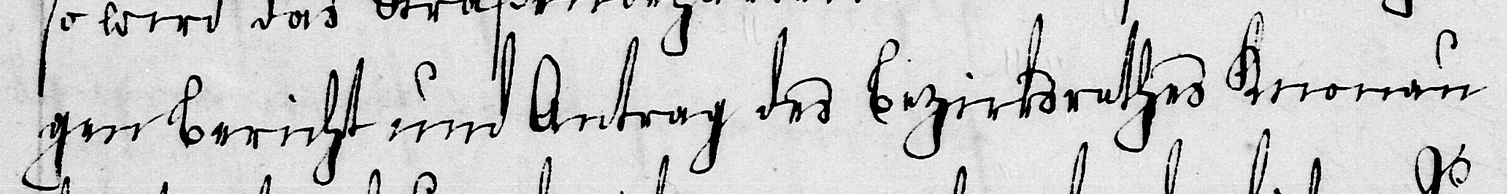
gen Bericht und Antrag des Bezirksrathes Knonau
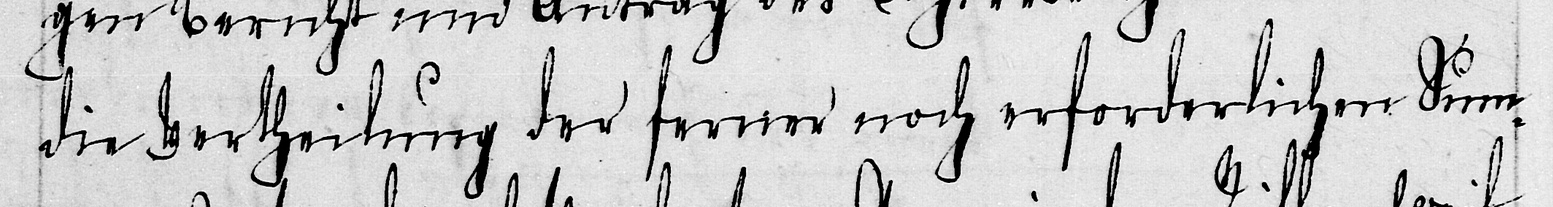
die Vertheilung der ferner noch erforderlichen Sum¬
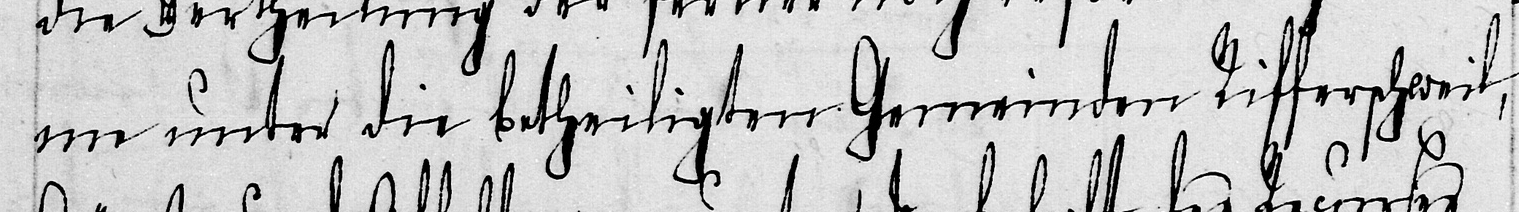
me unter die betheiligten Gemeinden Rifferschwe¬
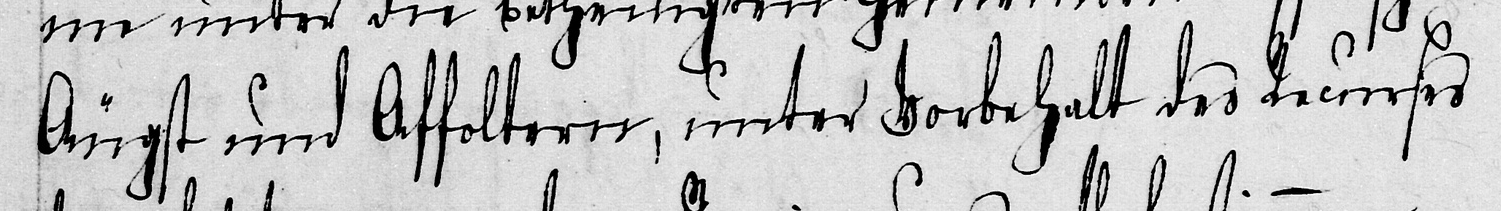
Äugst und Affoltern, unter Vorbehalt des Recurses
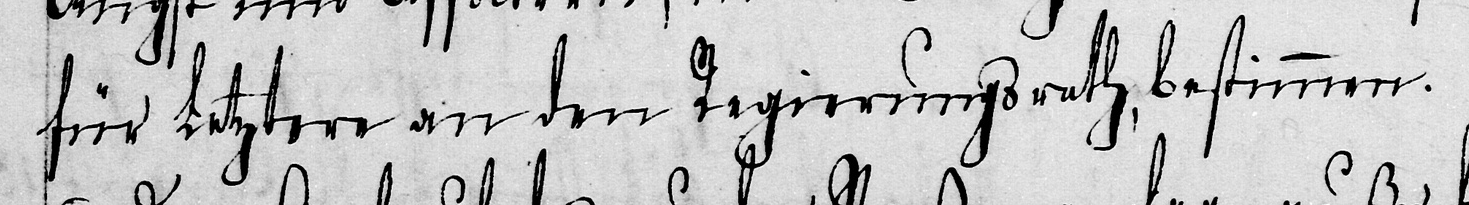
für Letztere an den Regierungsrath, bestimmen.
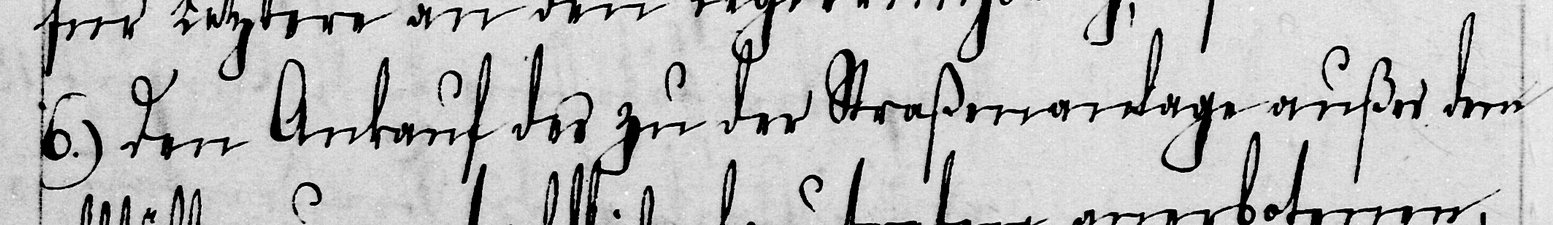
6.) Den Ankauf des zu der Straßenanlage außer dem
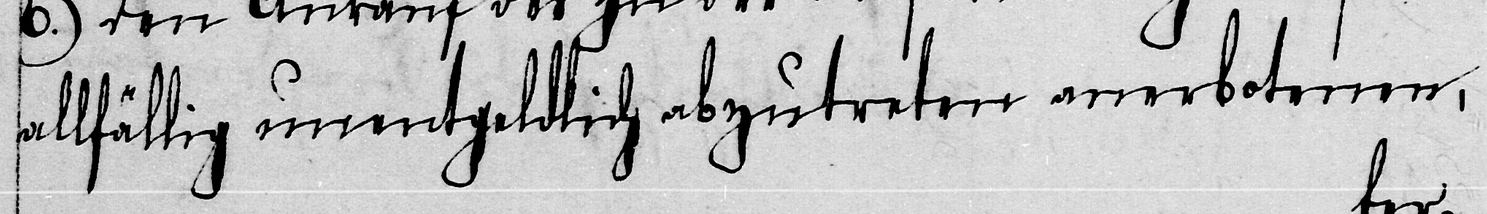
llfällig unentgeldlich abzutreten anerbotenen,
